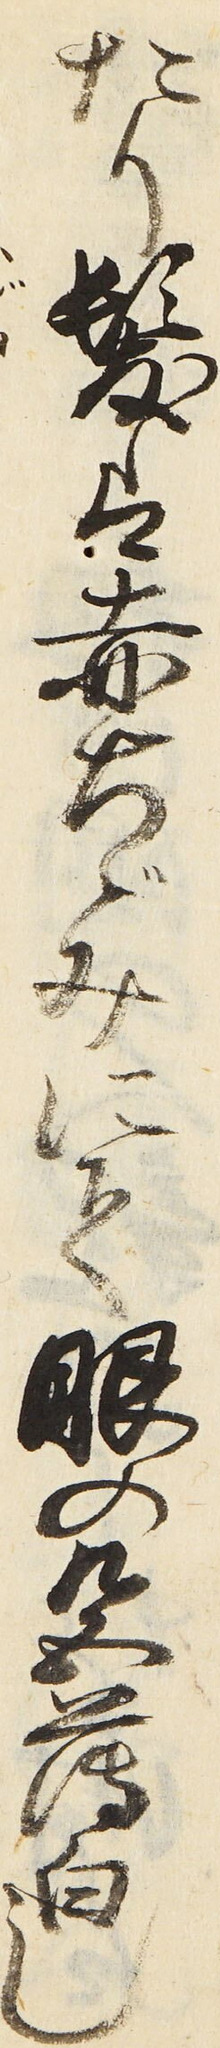たり髪は赤ちゞみにて眼の色薄白し
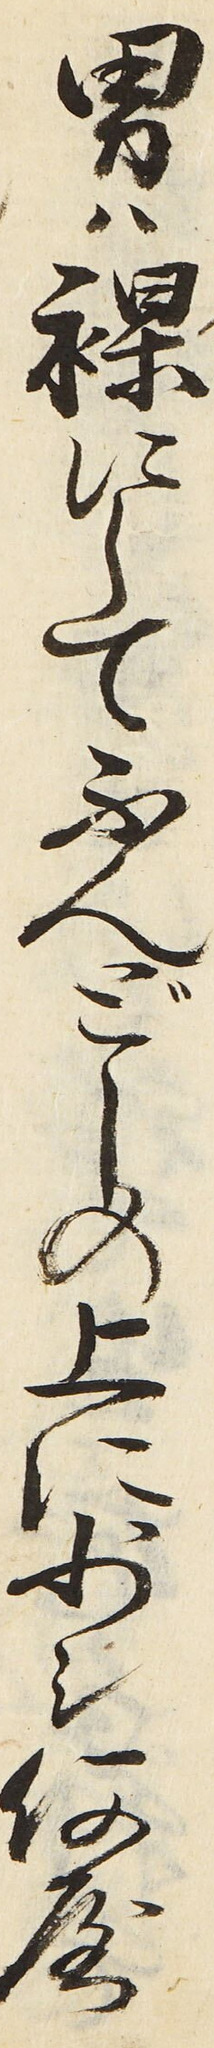男は裸にしてふんどしの上に少し何や
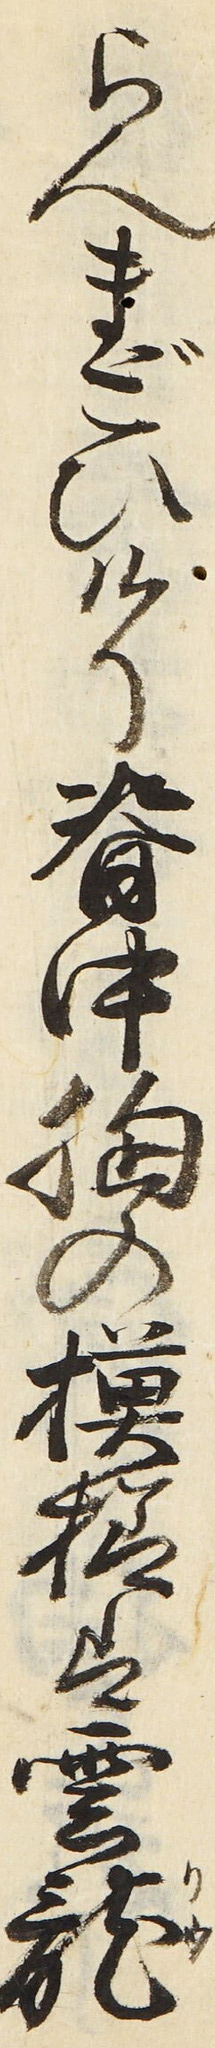らんまどひけり背中胸の模様は雲龍
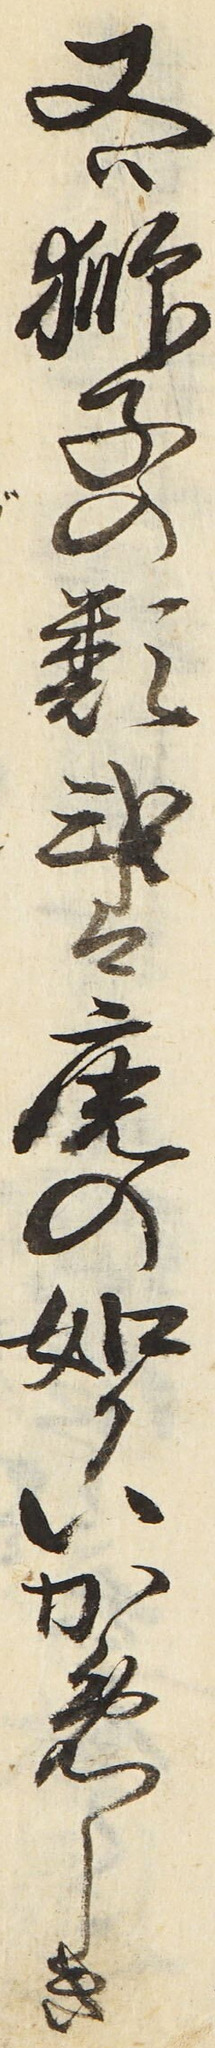又は獅子の類或はの如くいかめしき
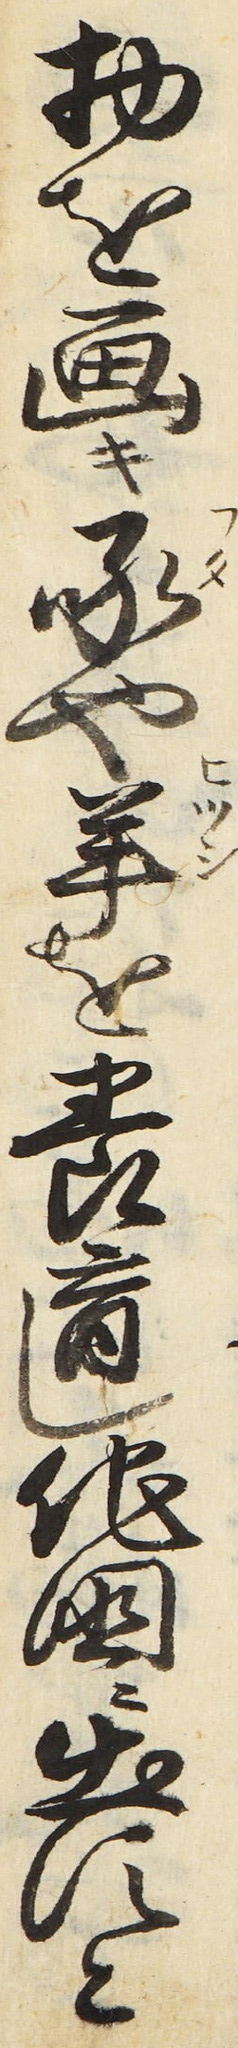物を画き豕や羊を養育し他国に出すと

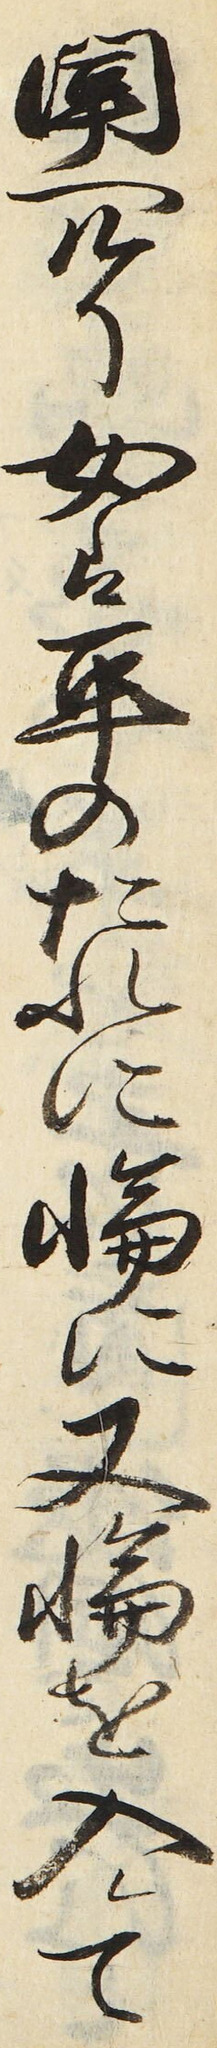聞へけり女は耳のたれに輪に又輪を入れて
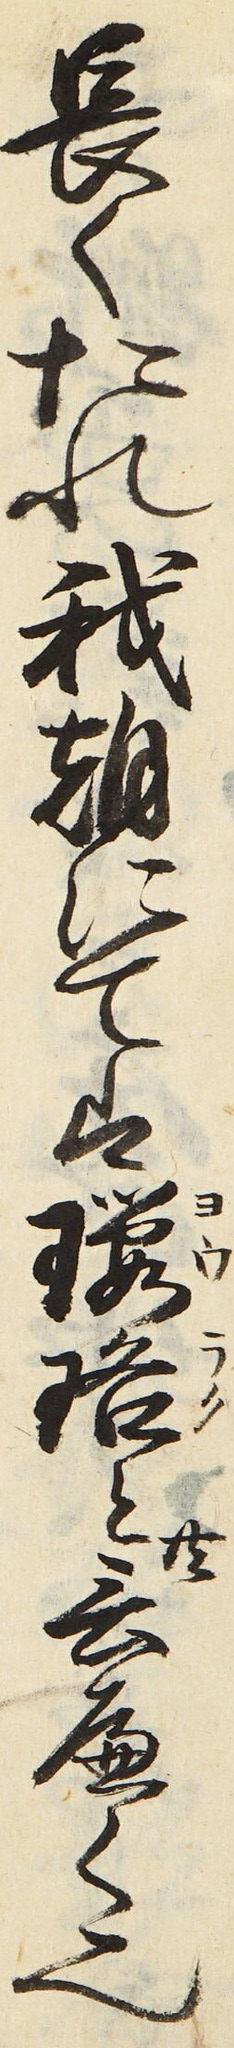長くたれ我朝にては瓔珞と共云へく也
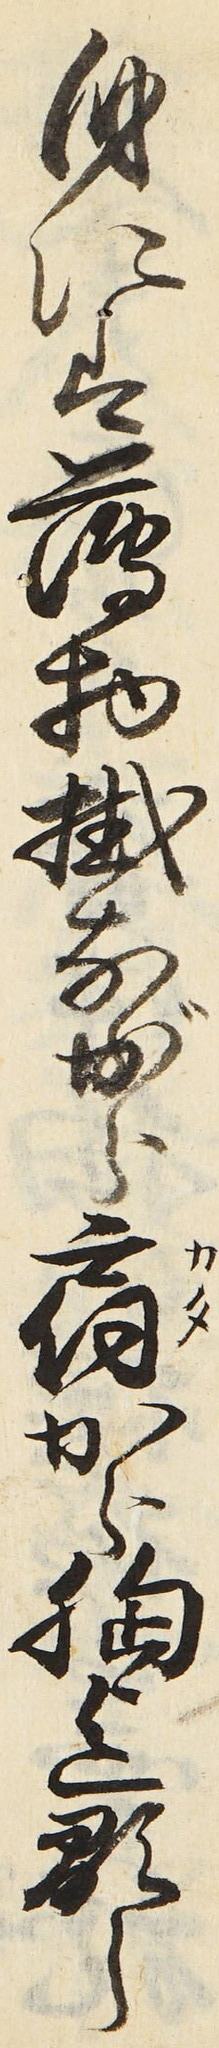身には薄物掛ながら肩から胸迠顕し
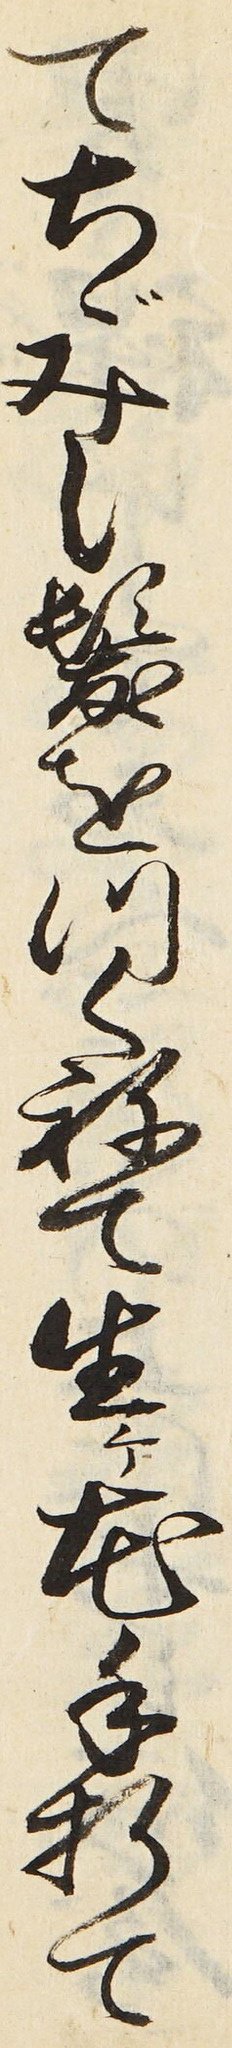てちゞみし髪をつくねて生け花手折て
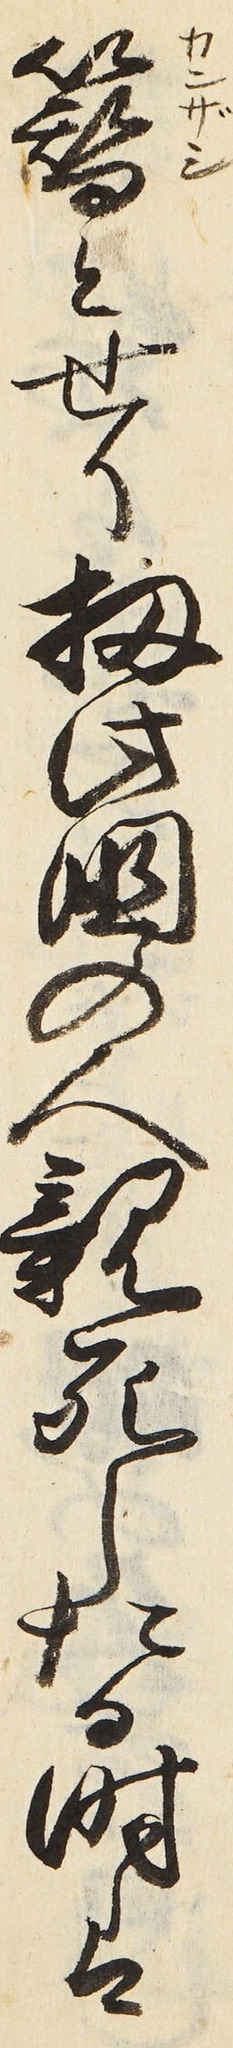簪とせり扨此国の人親死したる時は
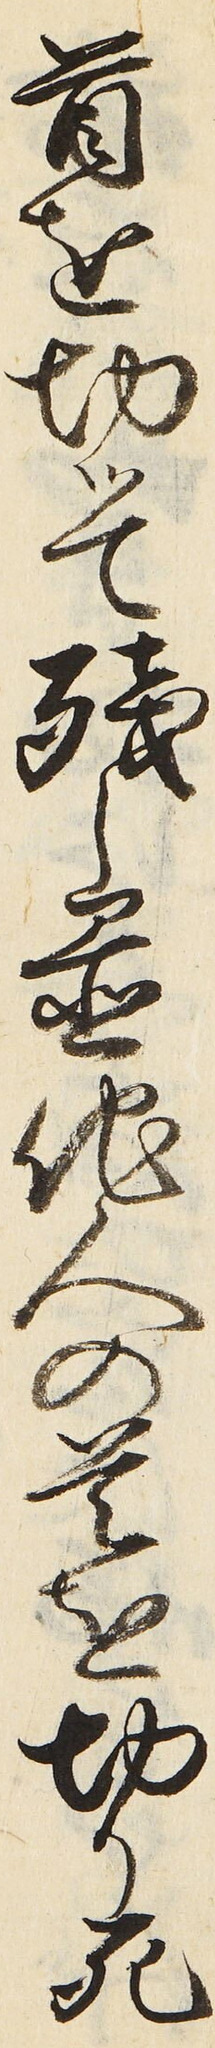首を切って残し置他人の首を切り死
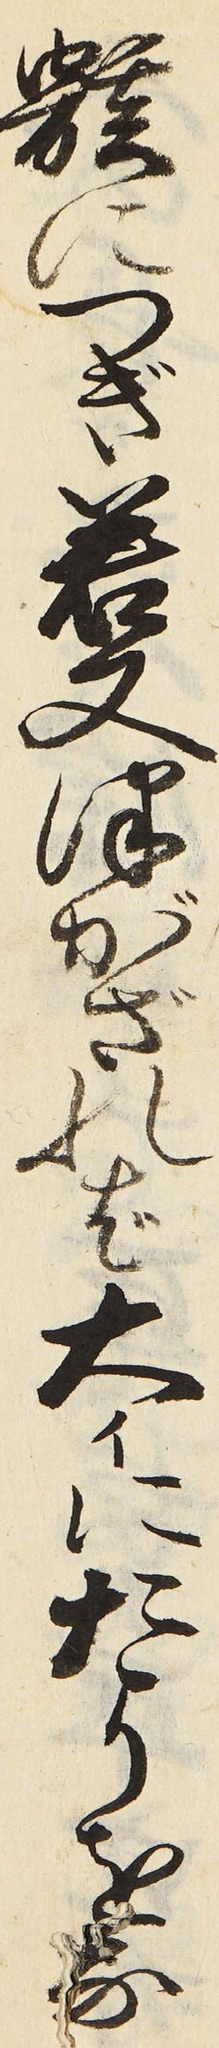骸につぎ若又つがざれば大いにたゝりをな
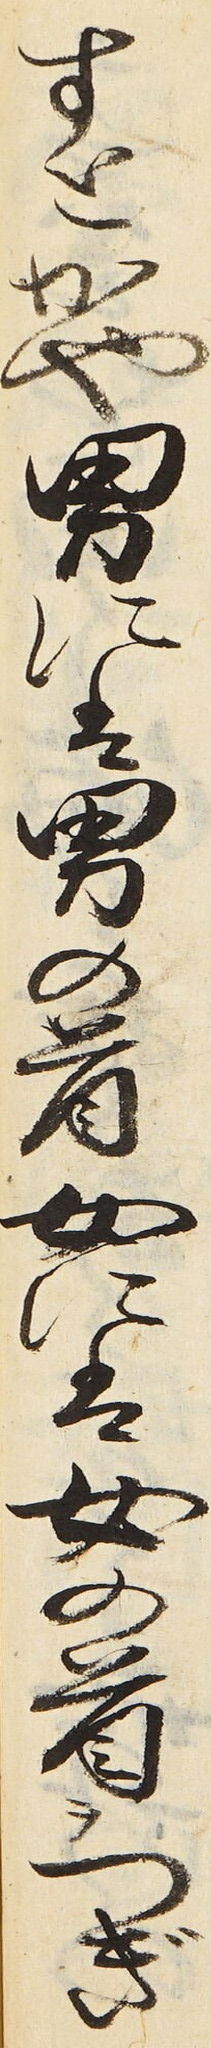すとかや男には男の首女には女の首をつぎ
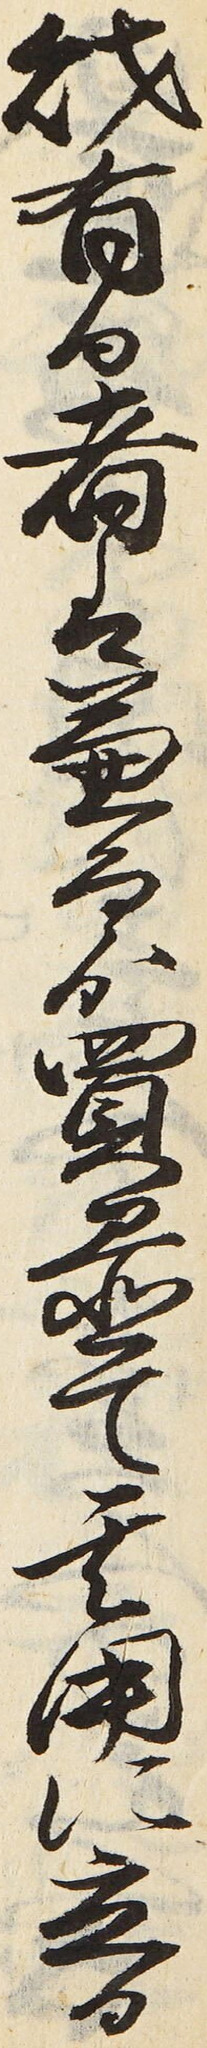財有る者は兼而ゟ買置て其用に立る
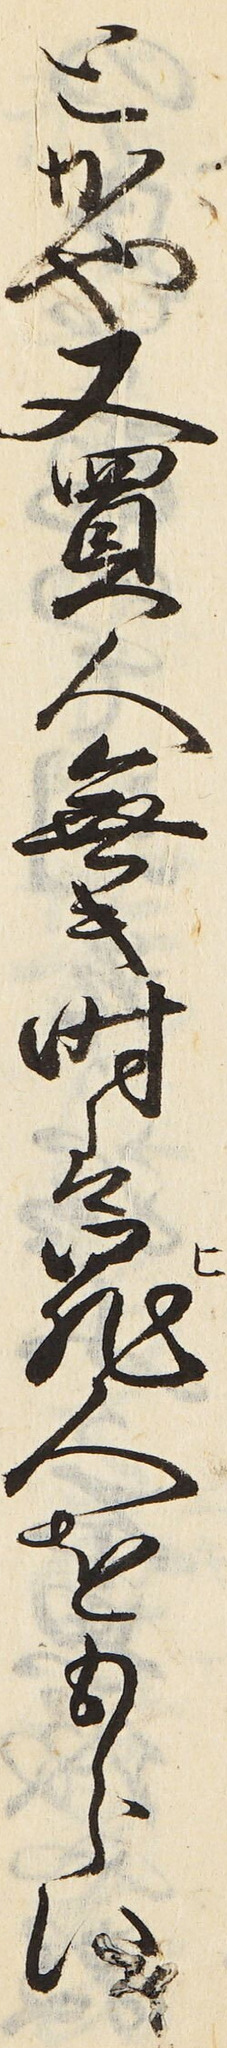とかや又買人無き時は罪人をもらい
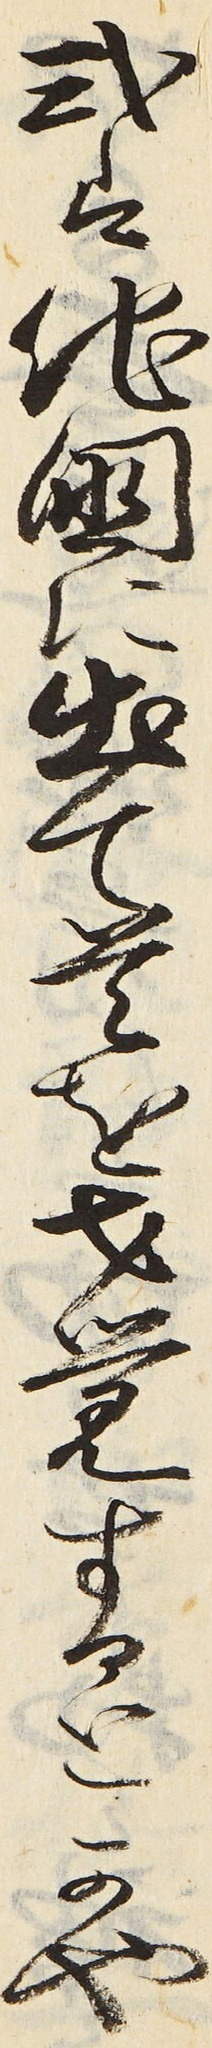或は他国に出て首を才覚するとかや
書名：華夷九年録
